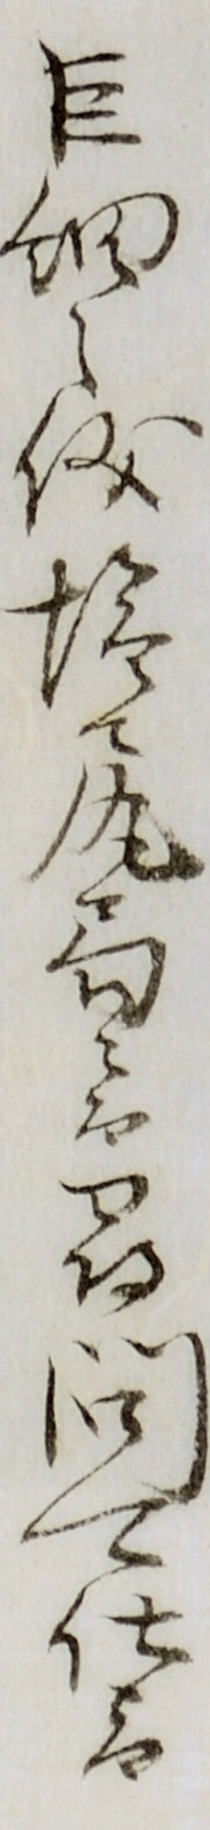巨細之儀塩尻局にて尋問可仕旨
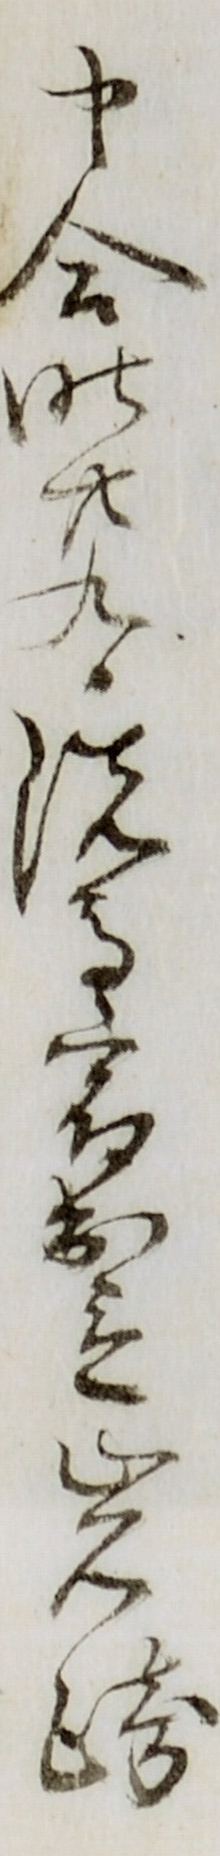申合昨廿九日洗馬宿出立岩崎
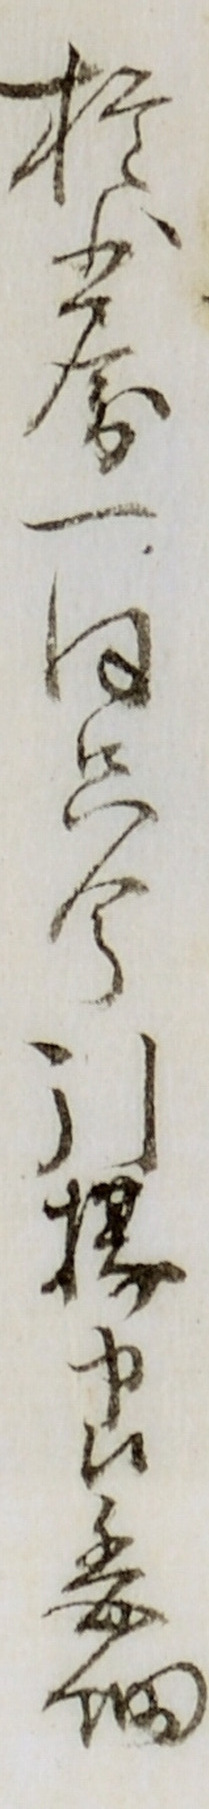権少属一同只今引揚申候委細
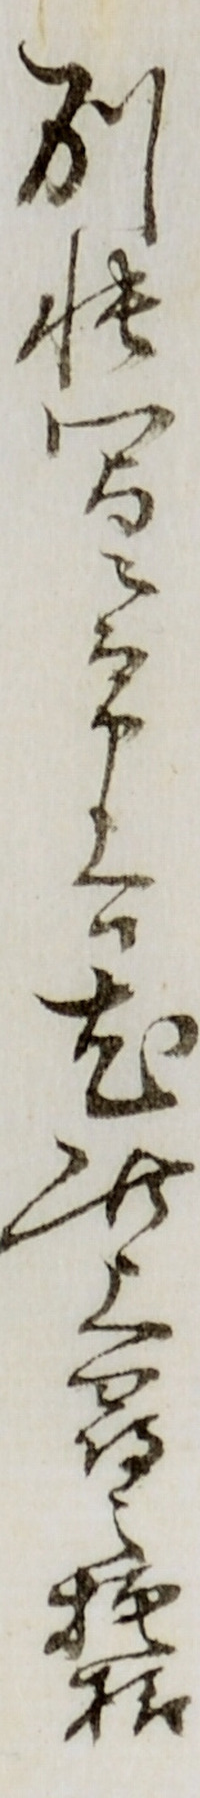別帳写にて申上候尤此上尋之模様
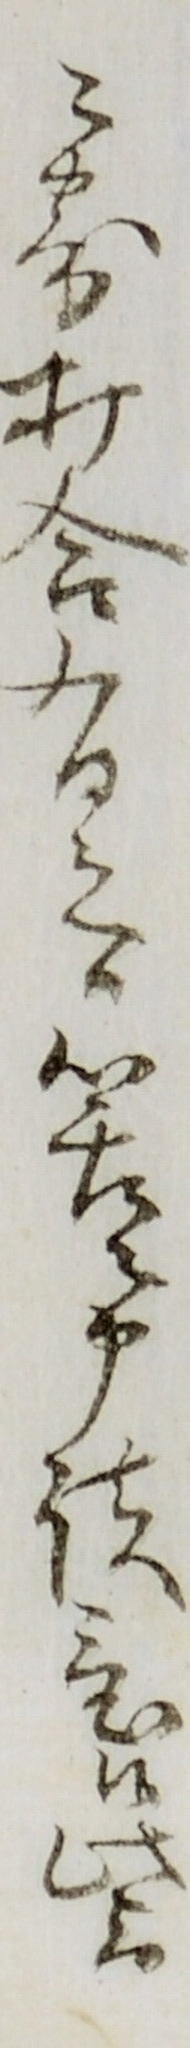に寄打合有之候筈に申談置候此旨
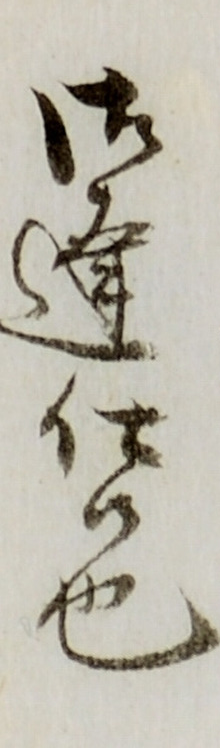御達仕候也
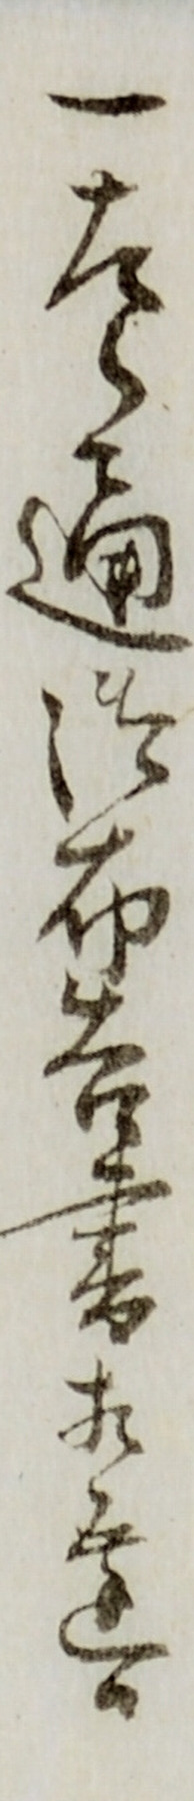一左之通御布告書相達候
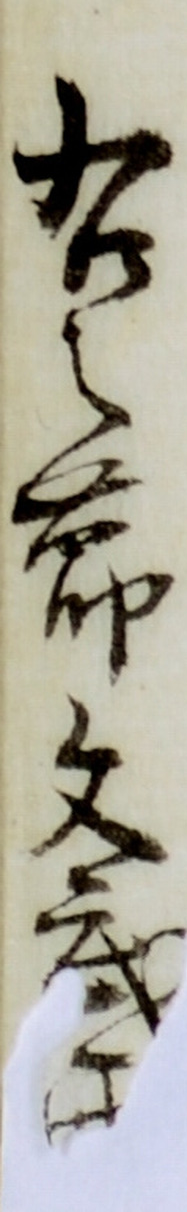右之節文武兵士

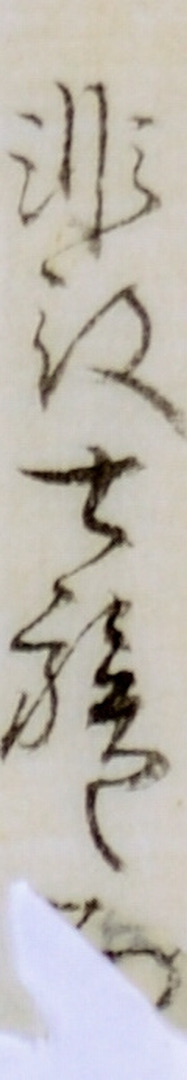非役士族之面
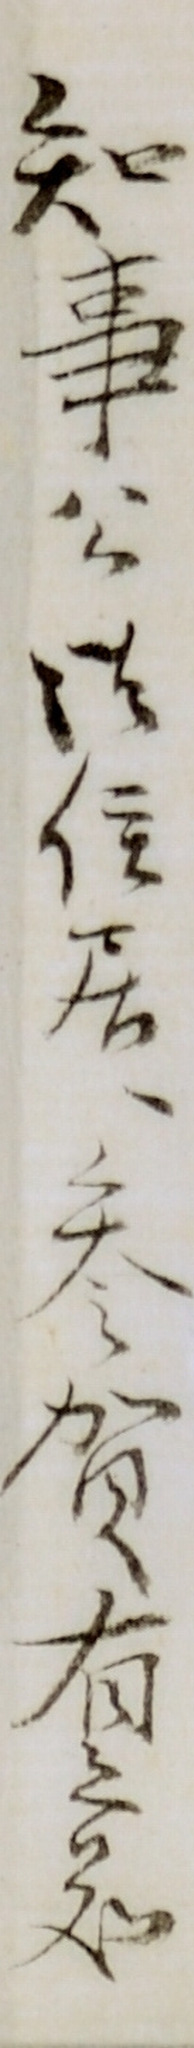知事公御住居へ参賀有之候処
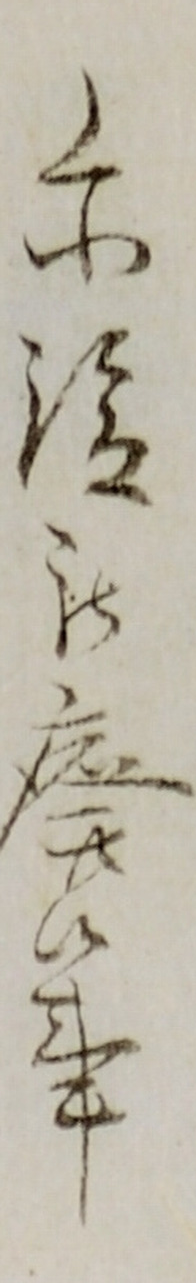爾後被廃候事
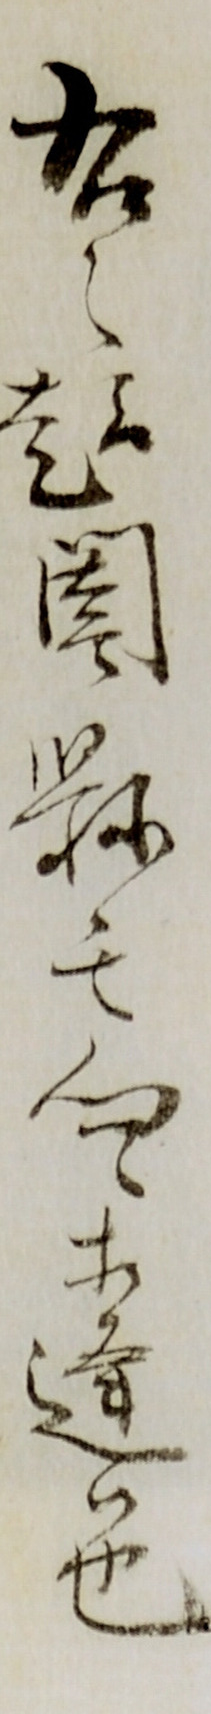右之趣闔県其向々へ相達候也
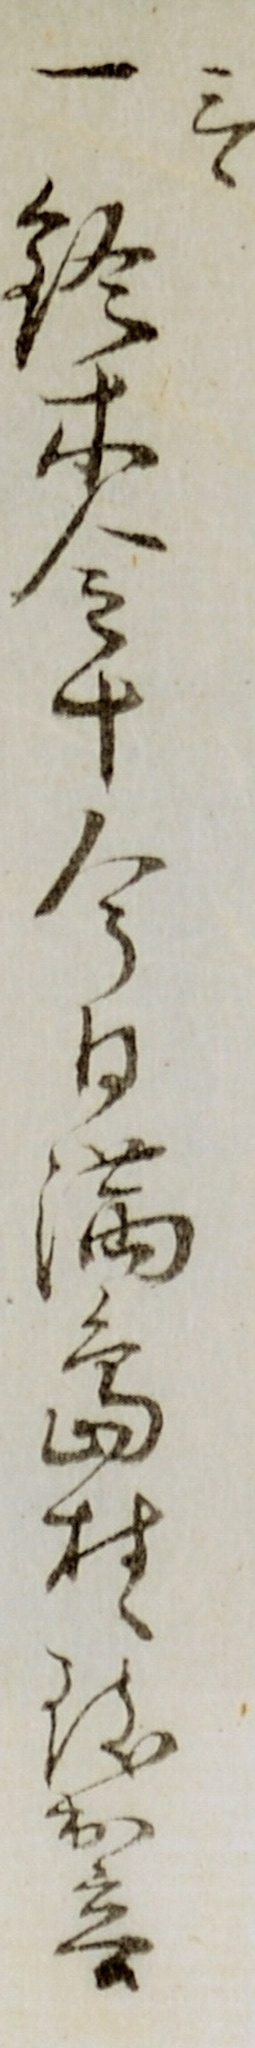一鈴木金十今日満島村へ致出立候
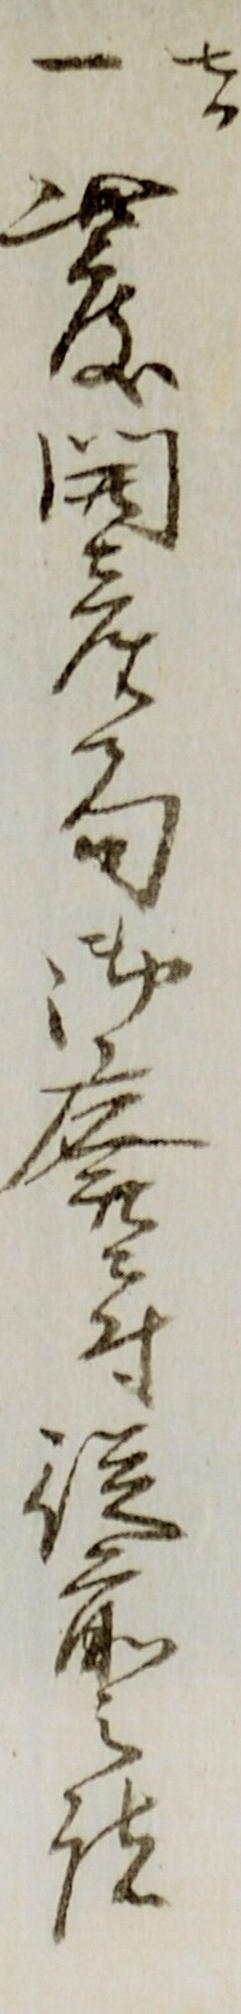一此度開産局御廃に付従前之諸
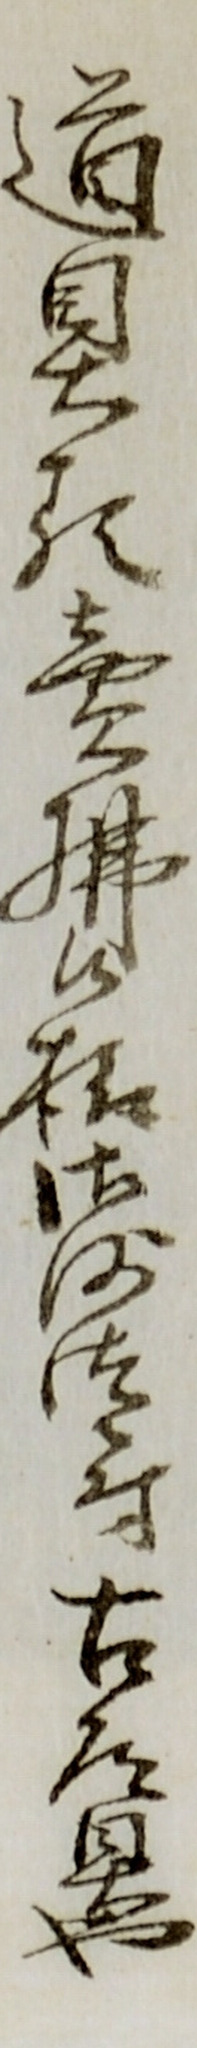道具類売払候様御沙汰に付古道具や
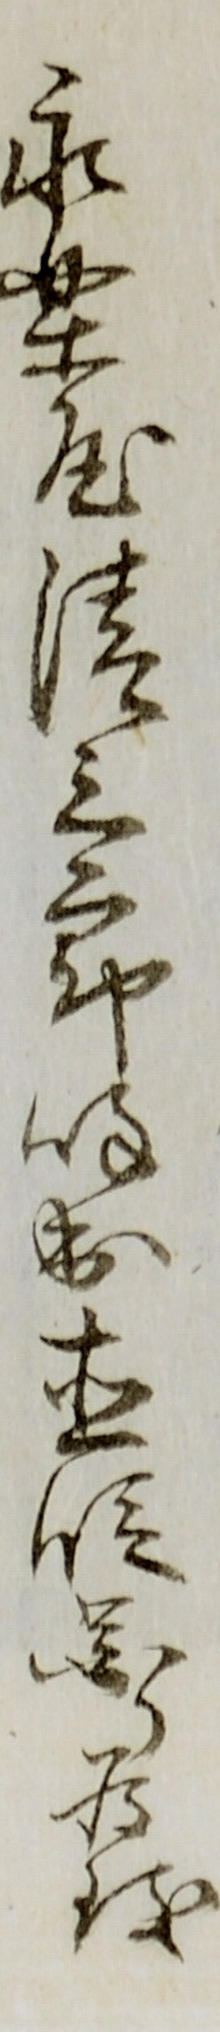永楽屋清三郎呼出直段図り為致
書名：山林方諸事御用留
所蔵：伊那市立高遠町図書館・合同会社AMANE
